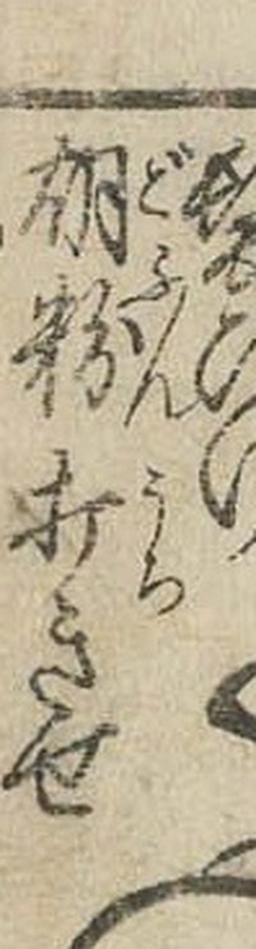胡粉打きせ
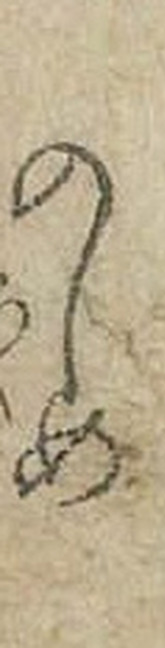のしめ
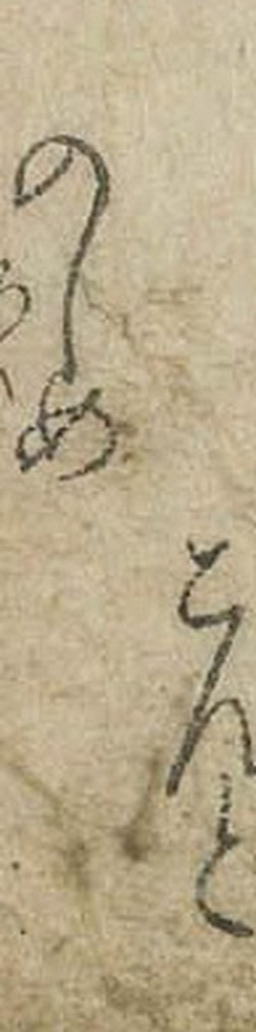のしめ
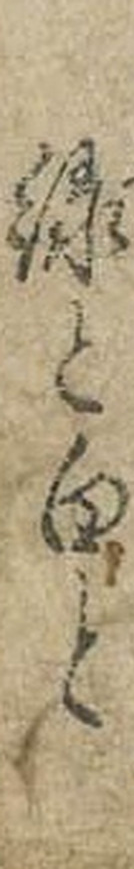緑と白と

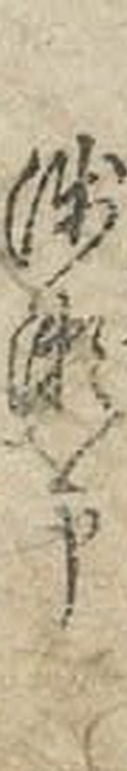浅瀬を申
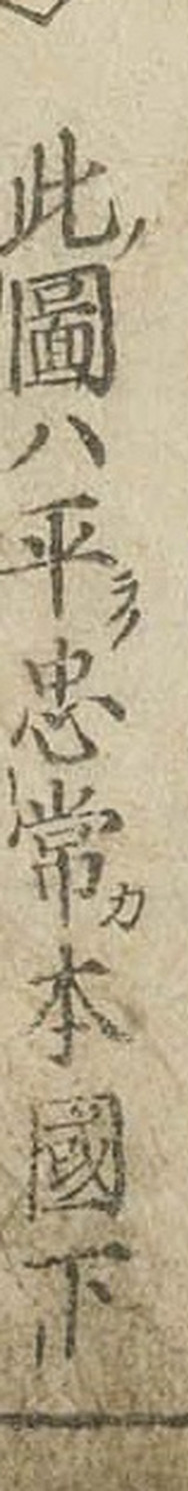此-国ハ平忠-常本国下-
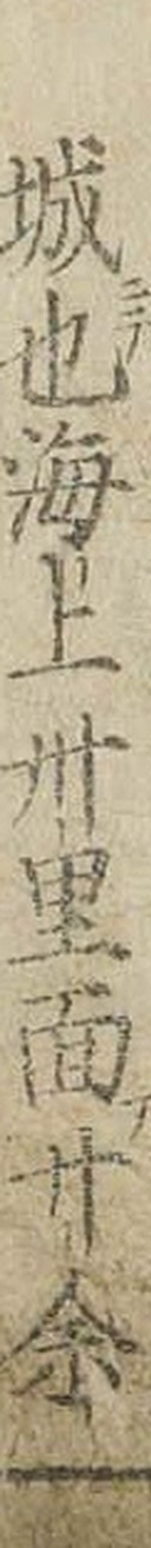城海-上卅‐里面廿-余-

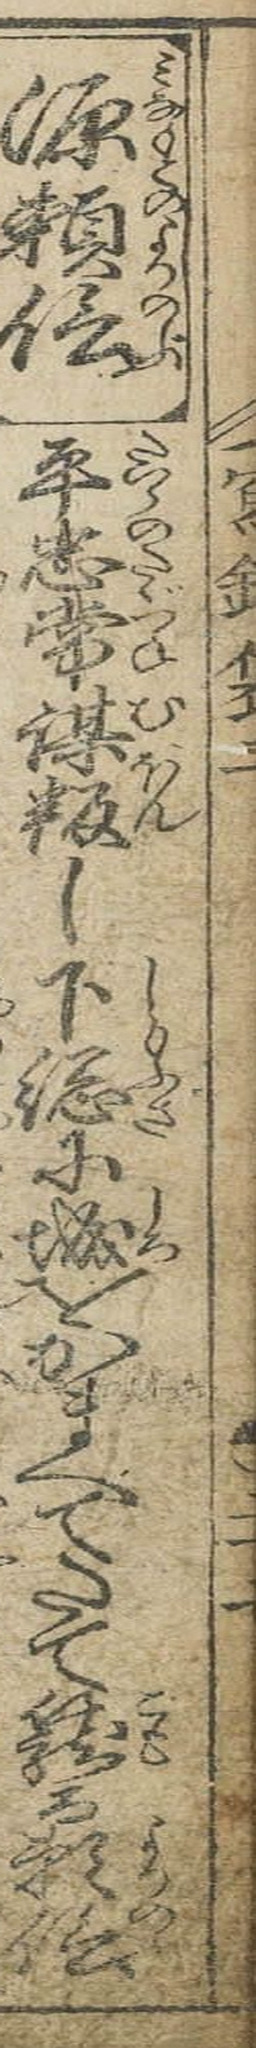源頼信平忠常謀叛し下総に城をかまへてたて籠る頼信
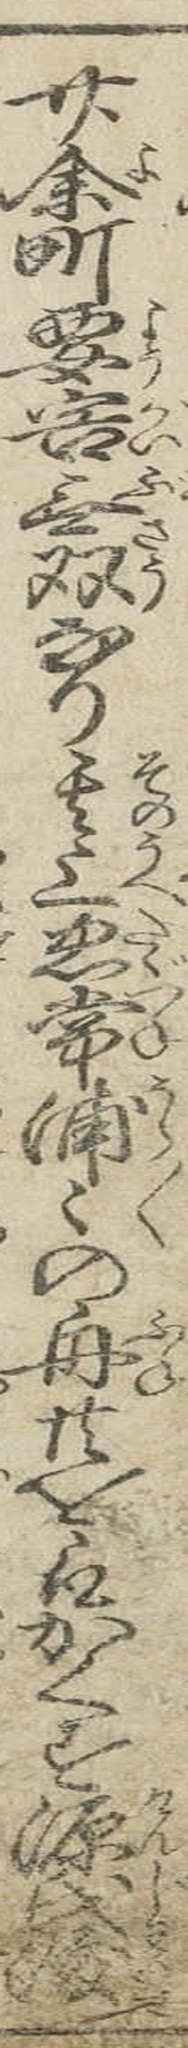廿余町要害無双なり其上忠常浦々の舟共を取かくす源氏渡
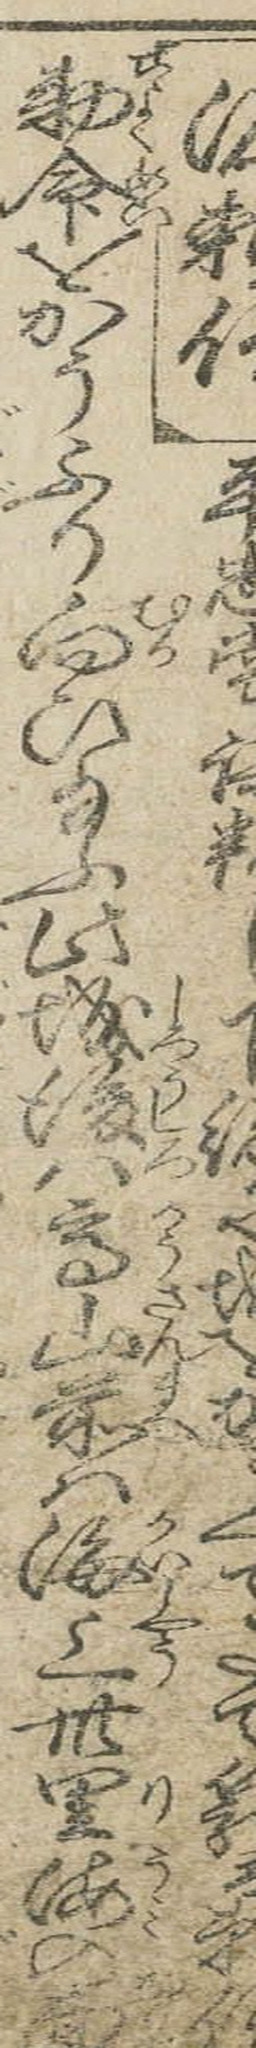勅命をかうふり向ひ給ふ此城後は高山前は海上卅里海の面
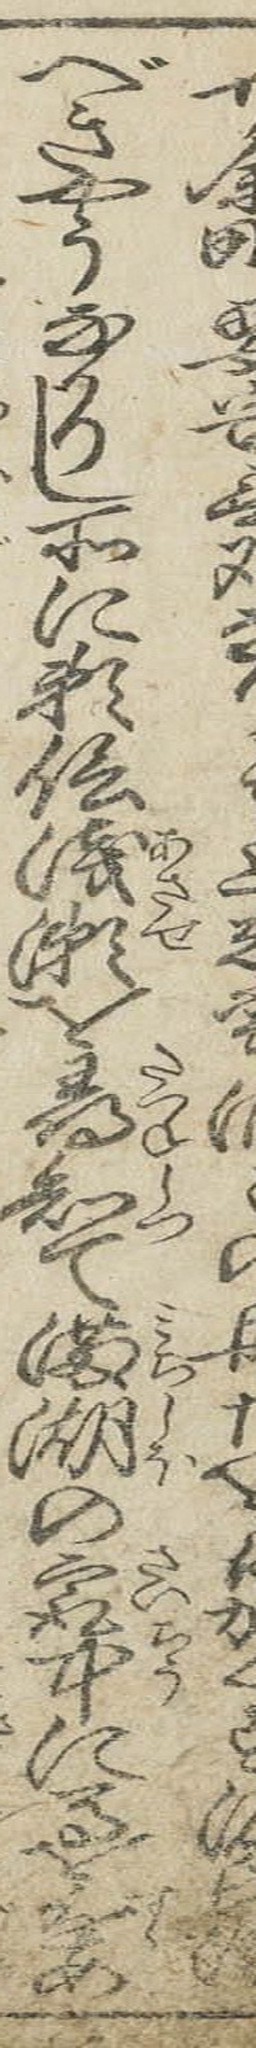べきやうなかりし所に頼信浅瀬を尋知て満潮の最中に馬を進め
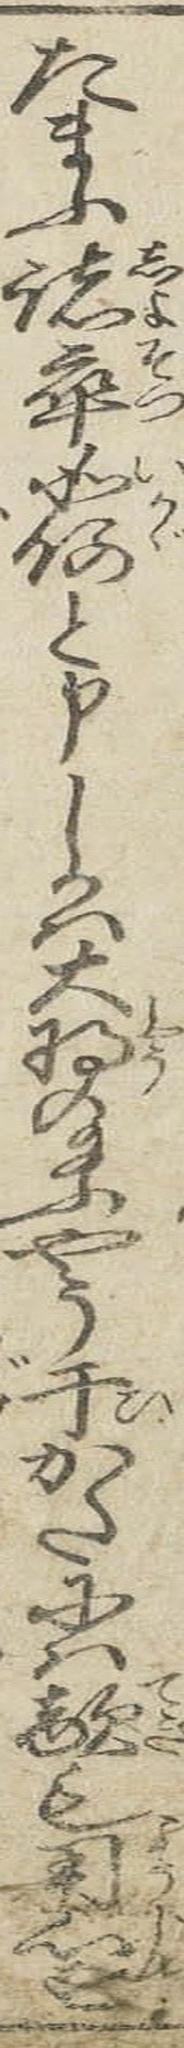たまふ諸卒如何と申しかは大将の給ふやう干かたには敵も用心す
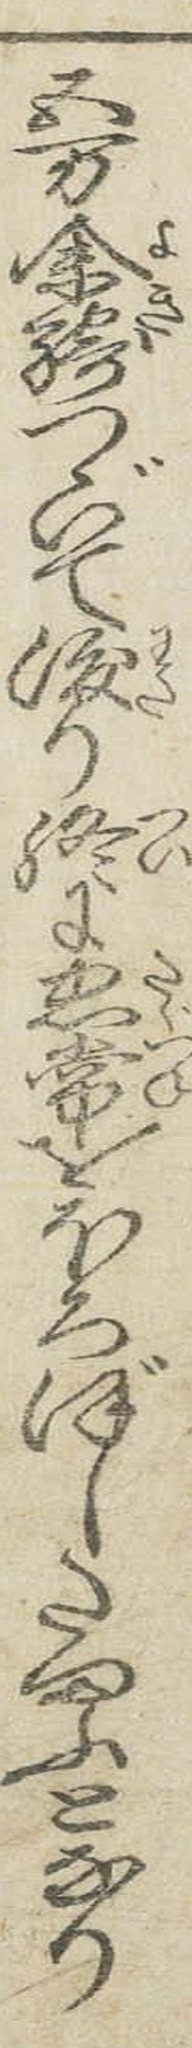五万余騎つゞいて渡り終に忠常をほろぼしたまふとなり
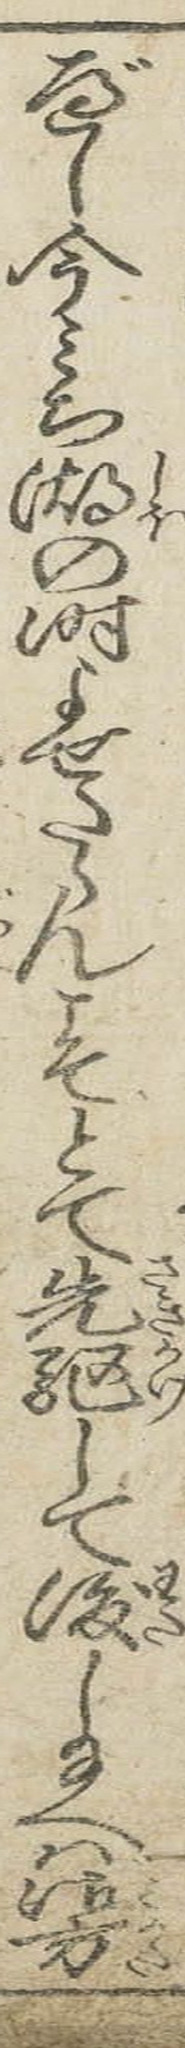べし今みち潮の時よせたらんこそとて先駆して渡し給へは御方
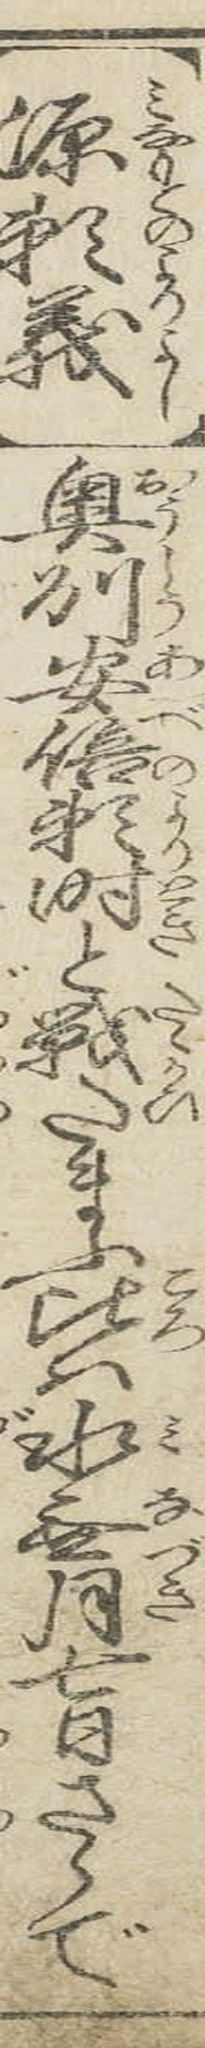源頼義奥州安倍頼時と戦たまふ比は水無月七日さらで
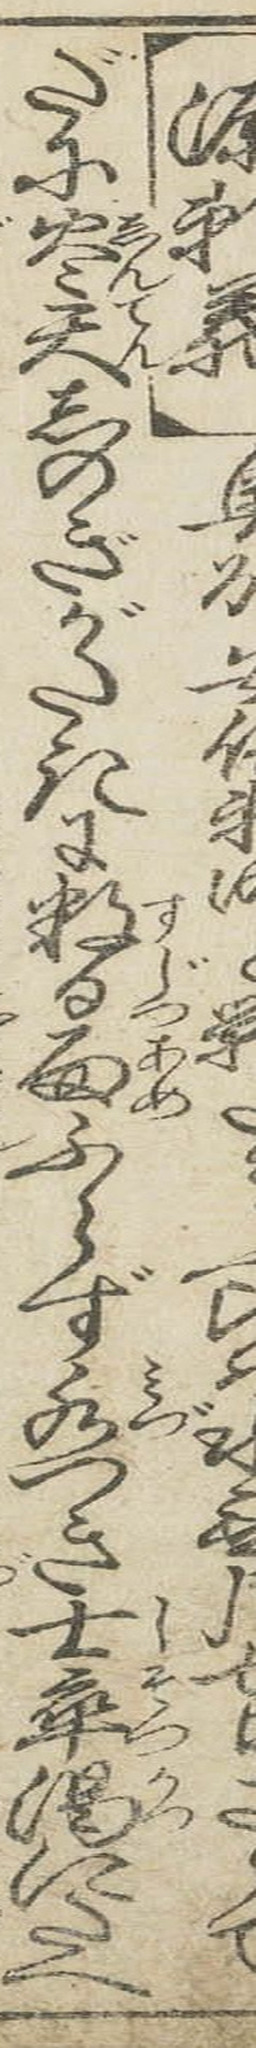だに炎天しのぎがたきに数日雨ふらず水つき士卒渇にたへ
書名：絵本写宝袋 9巻 2之巻
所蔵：東京学芸大学教育コンテンツアーカイブ
